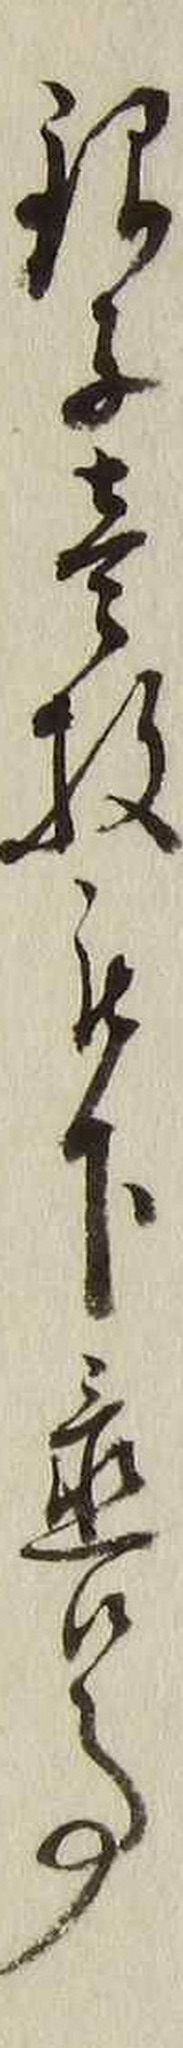銀子壱枚被下置候事
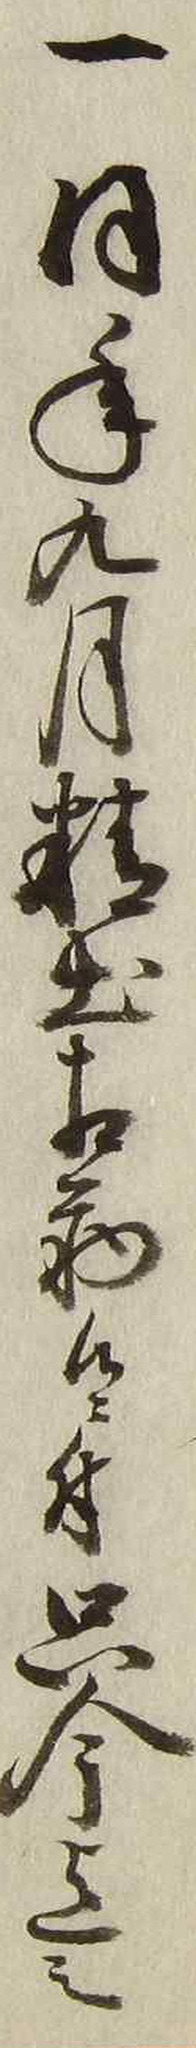一同年九月精出相勤候ニ付只今迄之
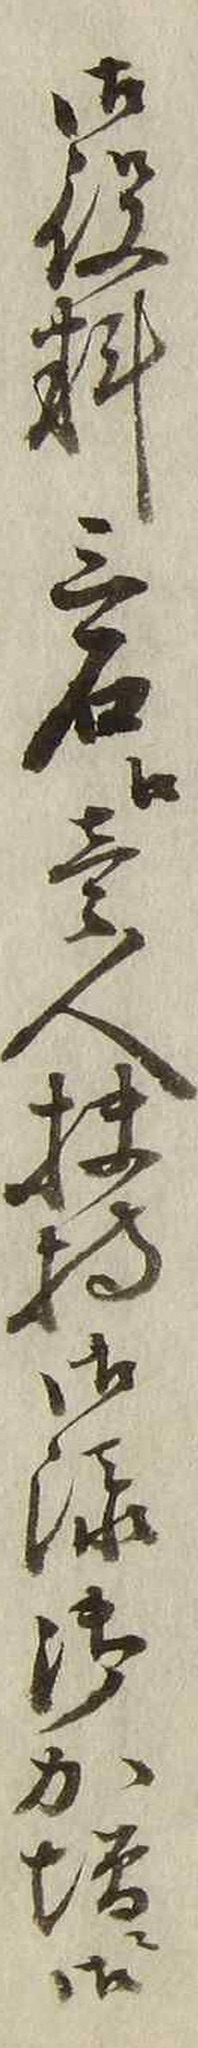御役料三石江壱人扶持御添御加増ニ御

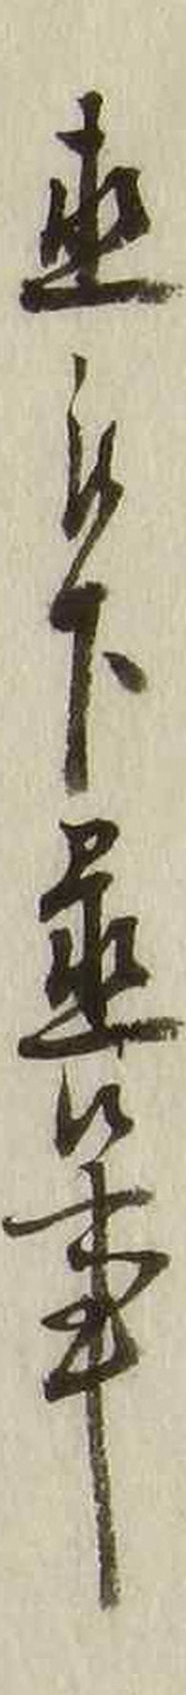直被下置候事
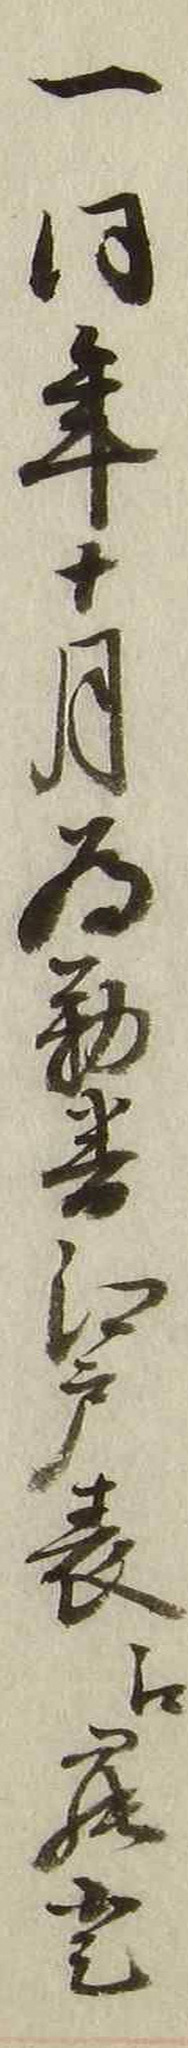一同年十月為勤番江戸表江罷登
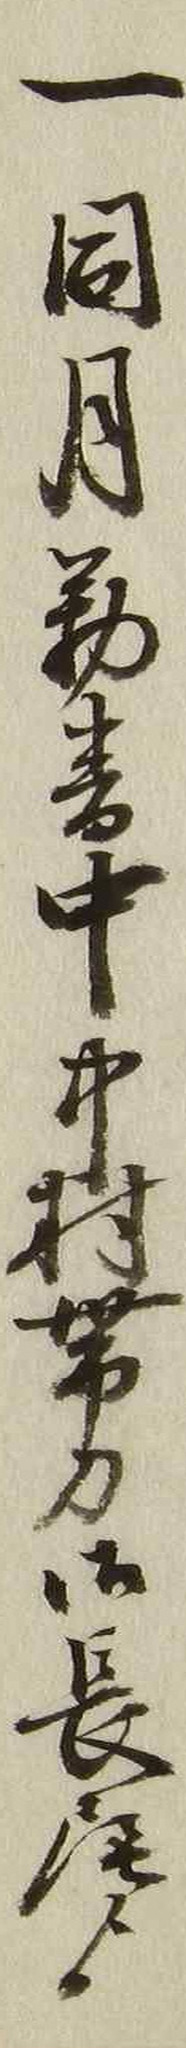一同月勤番中中村帯刀御長屋ゟ
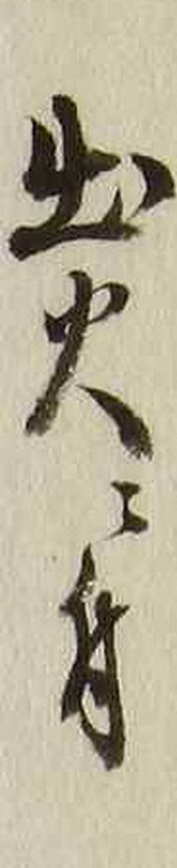出火ニ付
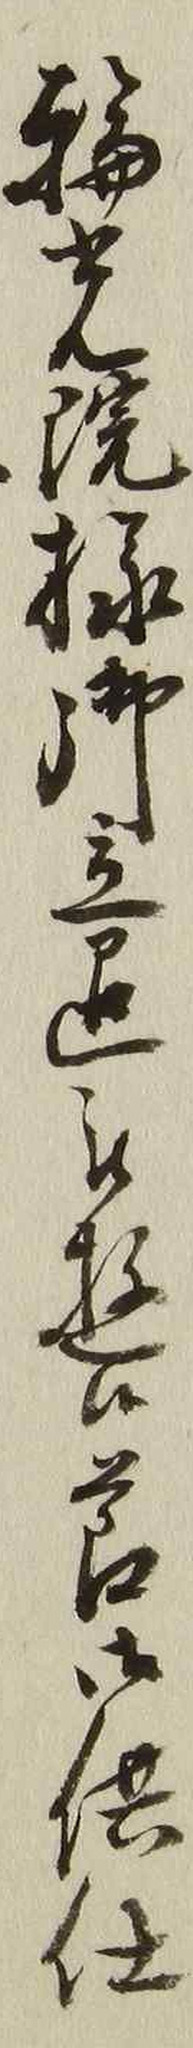輪光院様御立退被遊候節御供仕
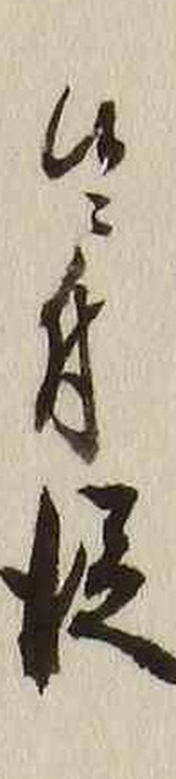候ニ付従
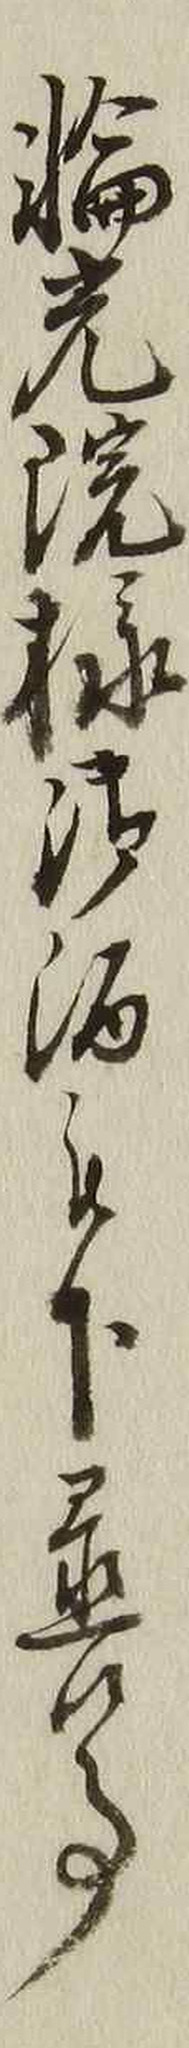輪光院様御酒被下置候事
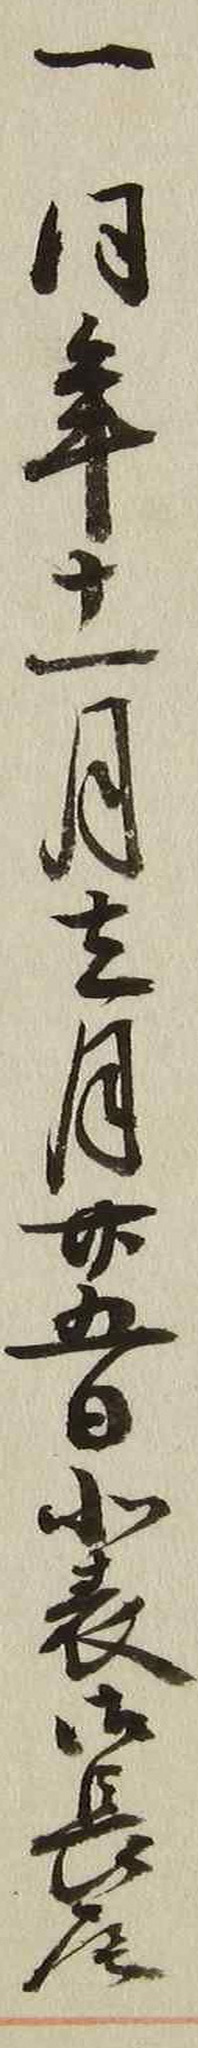一同年十一月去月廿五日北表御長屋
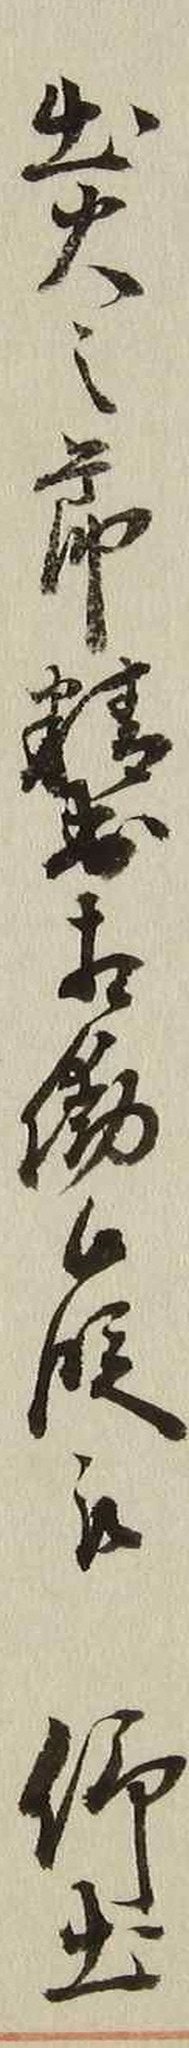出火之節精出相働候段被仰出
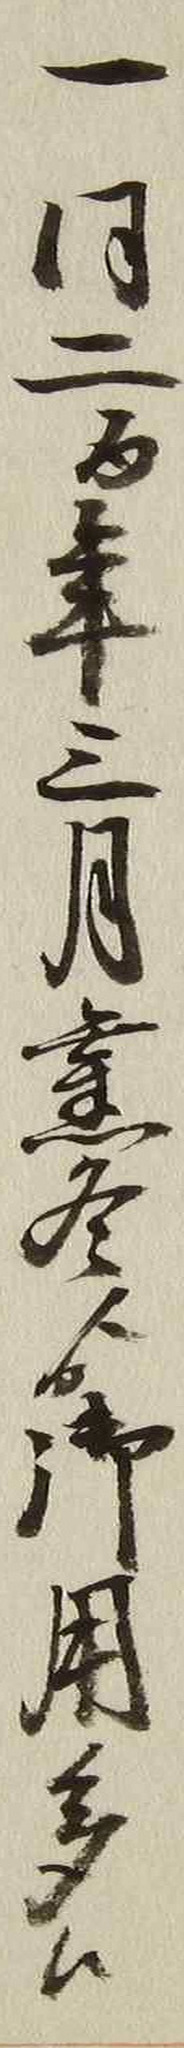一同二酉年三月旧冬ゟ御用多候
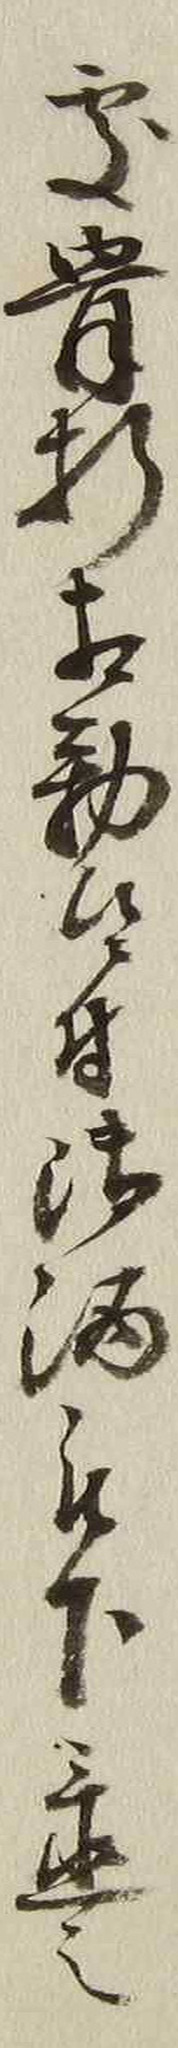処骨折相勤候ニ付御酒被下置之
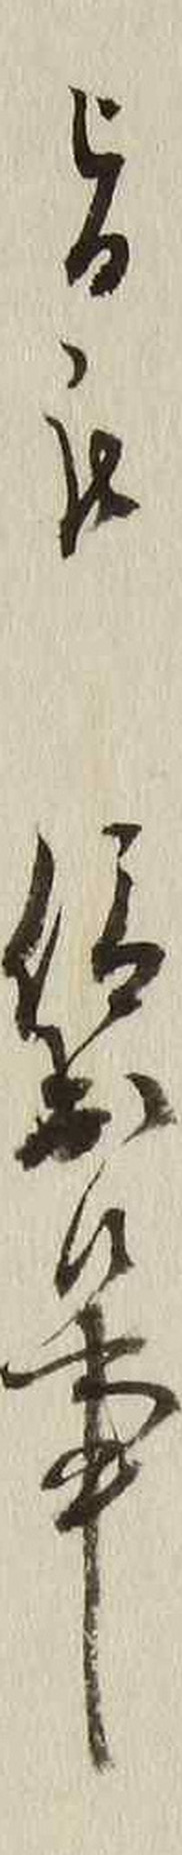旨被仰出候事
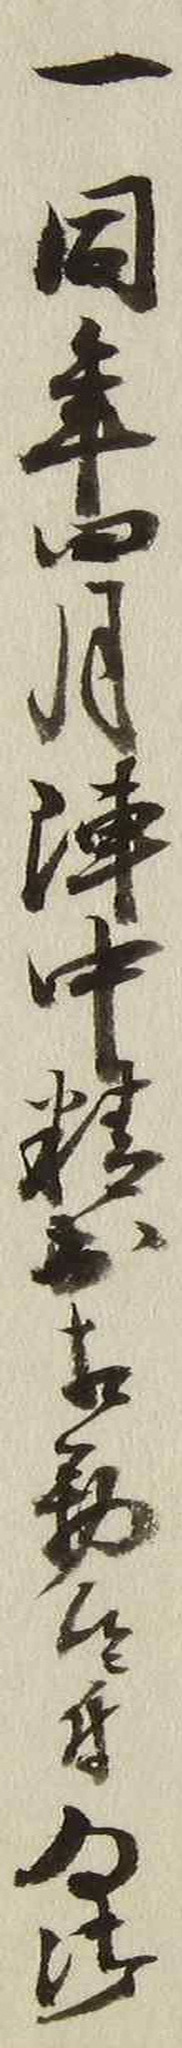一同年四月陣中精出相勤候ニ付為御
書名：諸士系譜　巻之27　い之部27
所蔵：会津若松市立会津図書館
